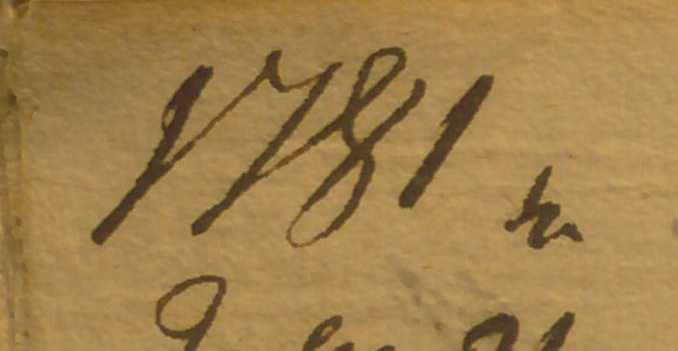1781
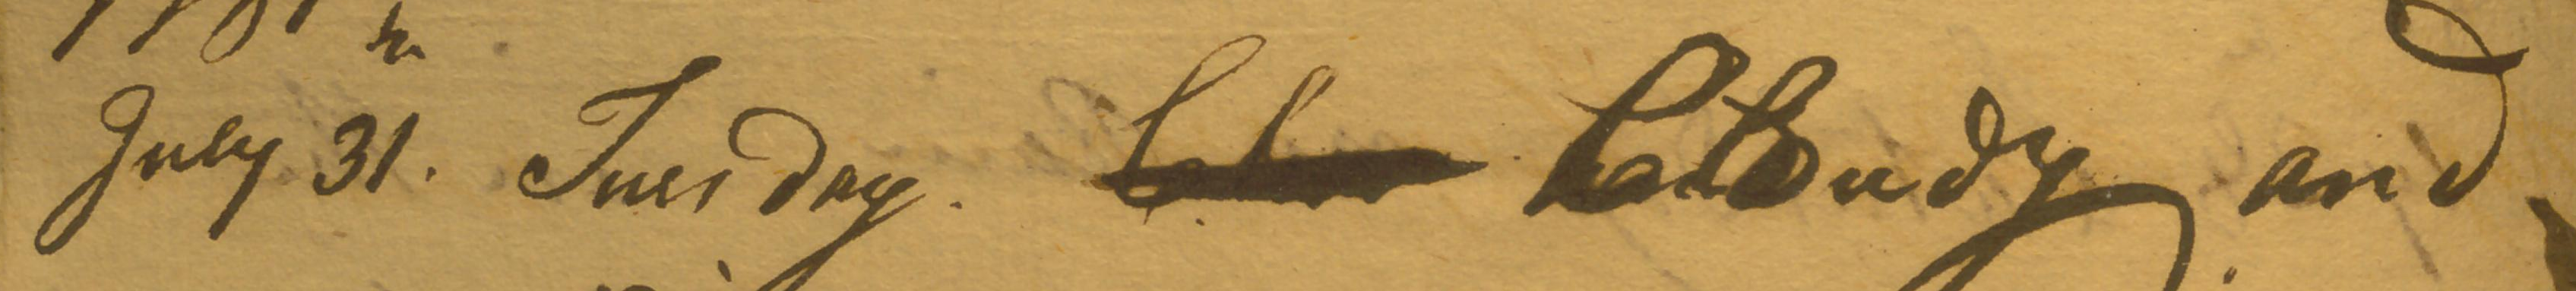July 31^th. Tuesday. [Clear] Cloudy and
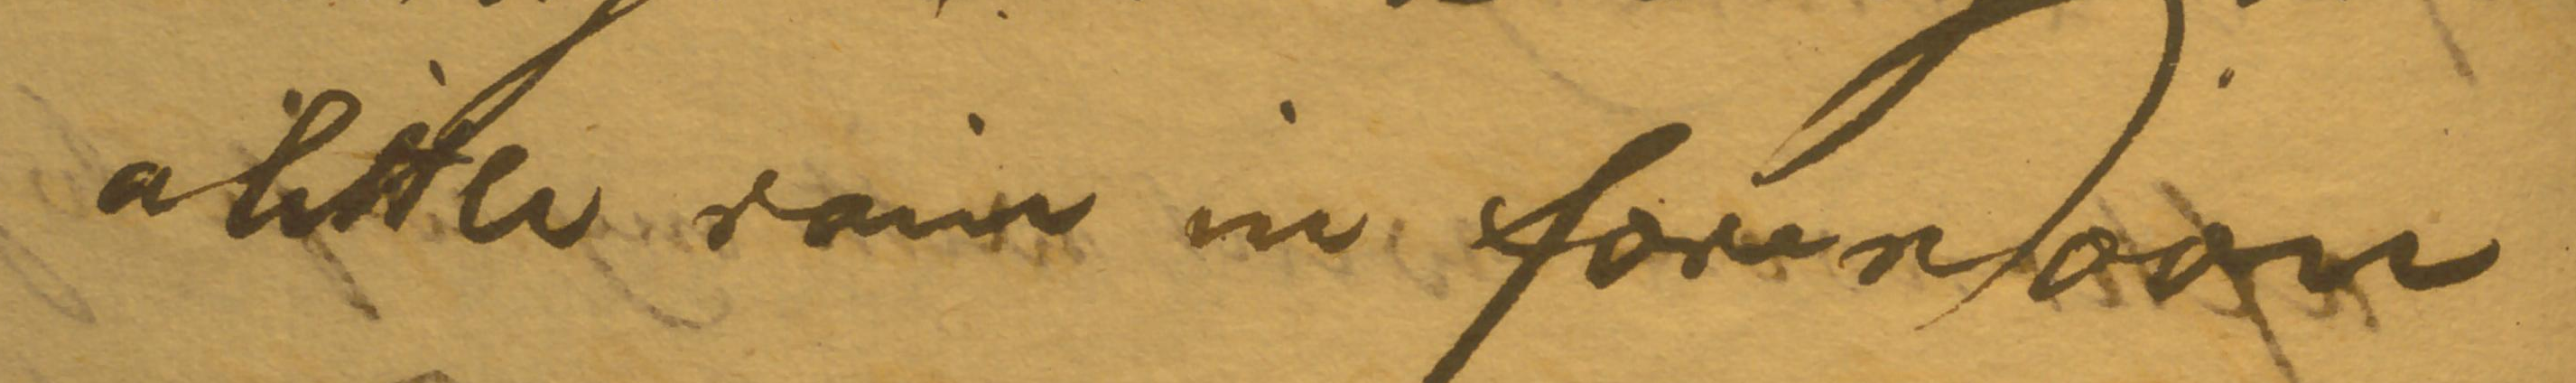alittle rain in forenoon
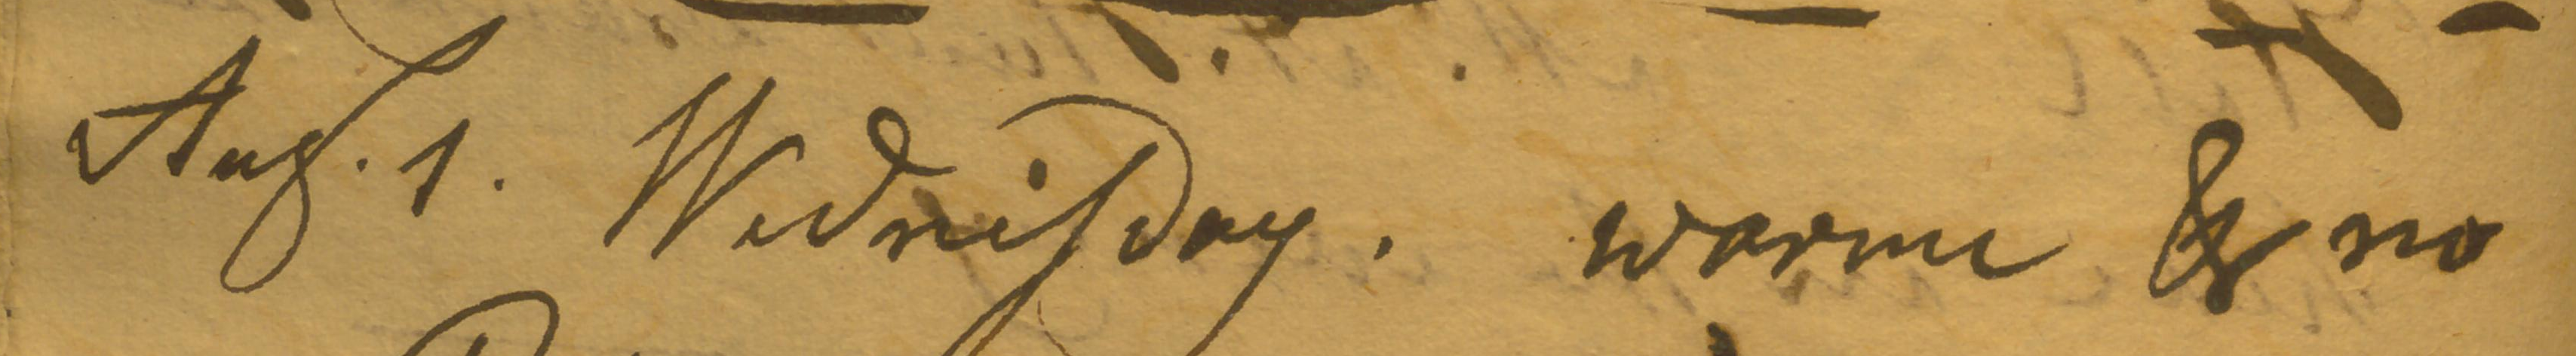Aug^t. 1. Wednesday: warme & no
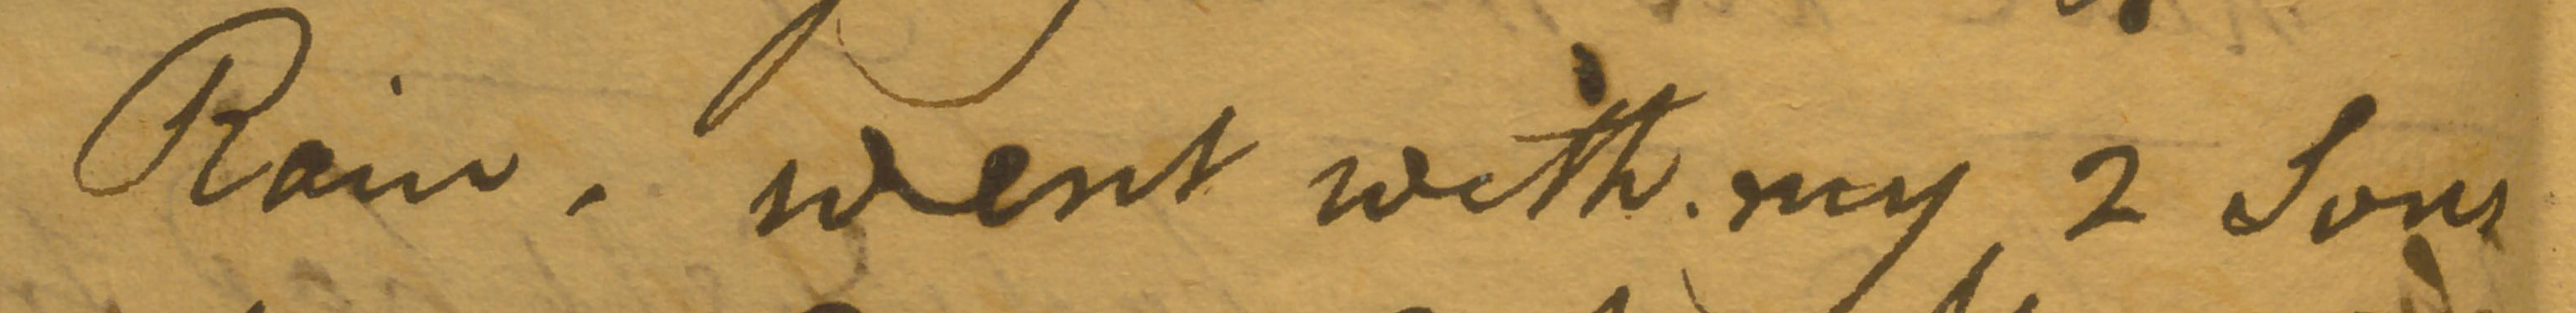Rain. went with my 2 Sons
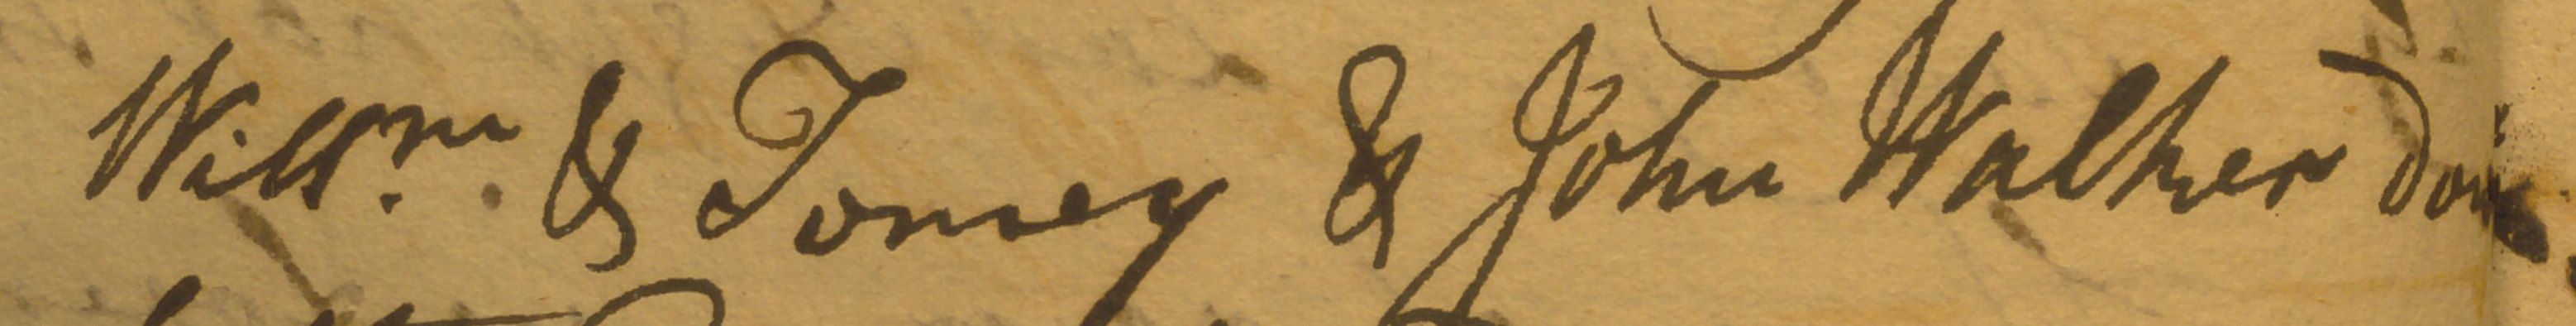Will^m. & Tomey & John Walker down
